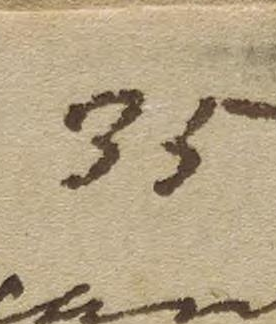35
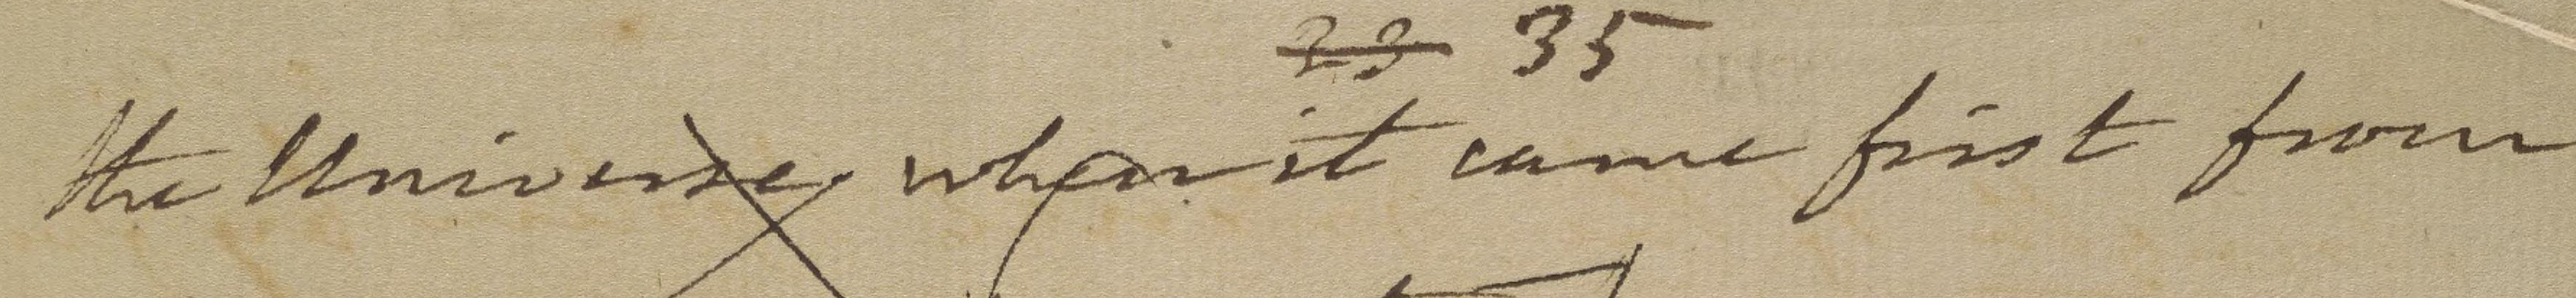the universe when it came first from
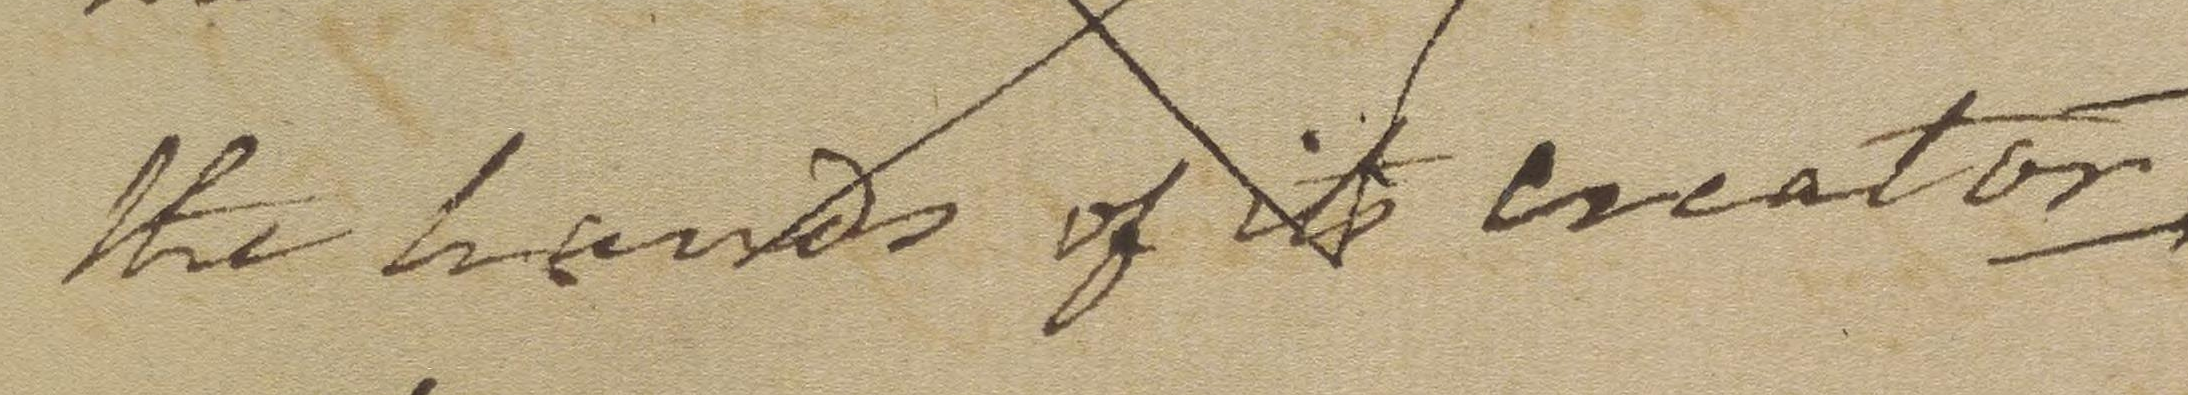the hands of its creator.)
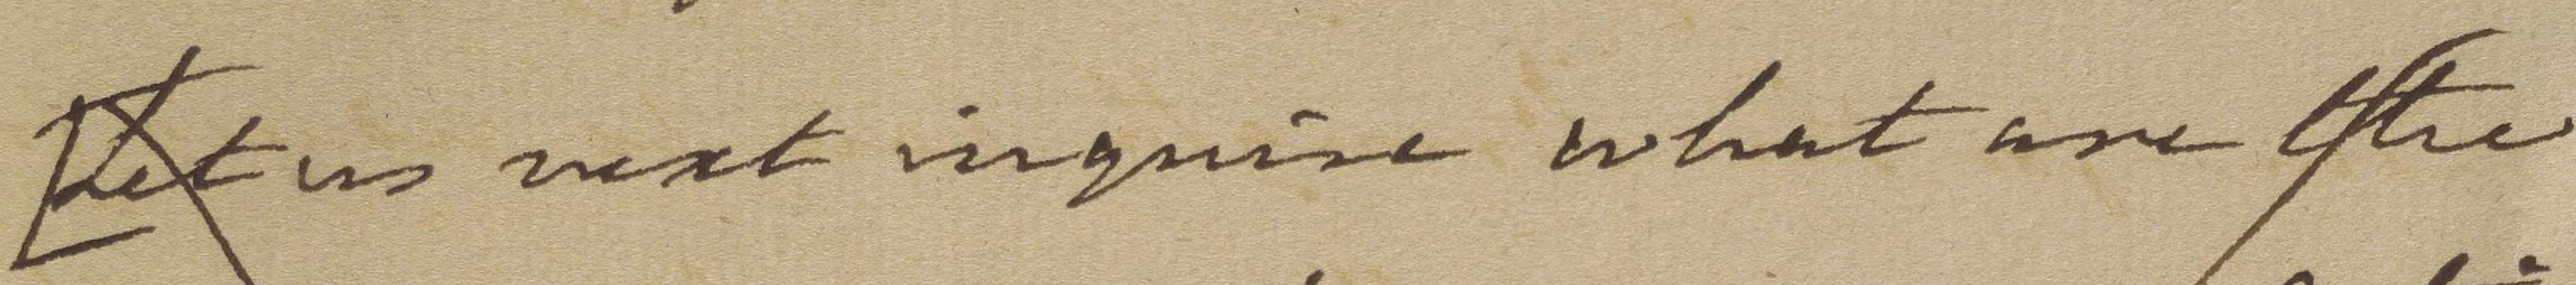(Let us next inquire what are the
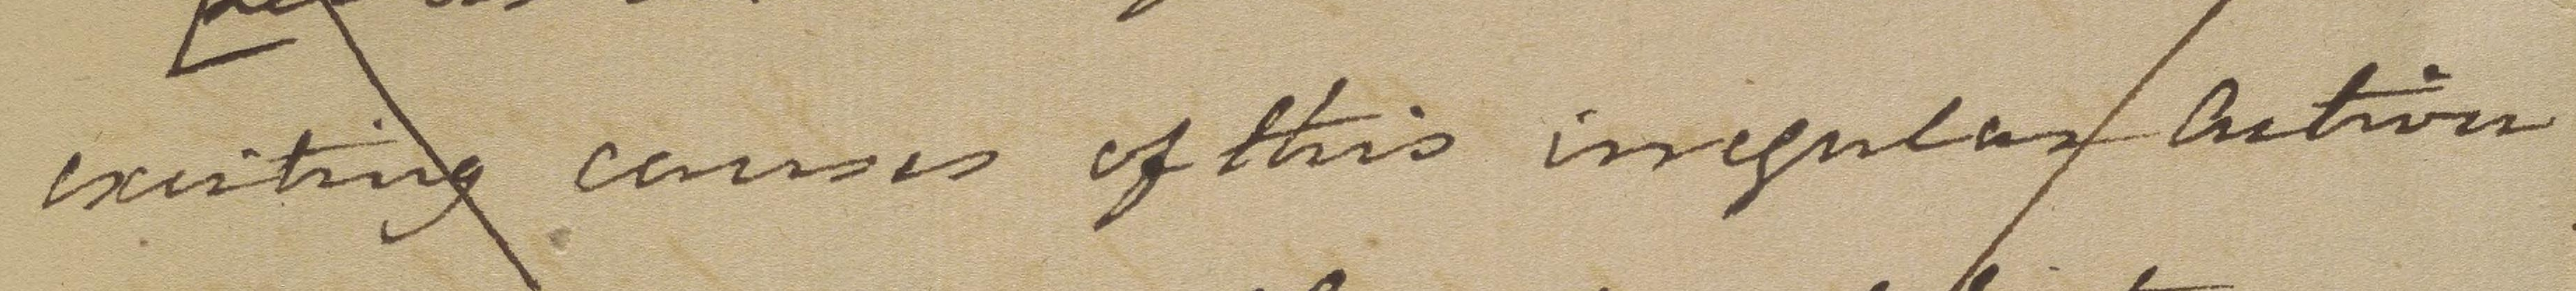exciting causes of this irregular action
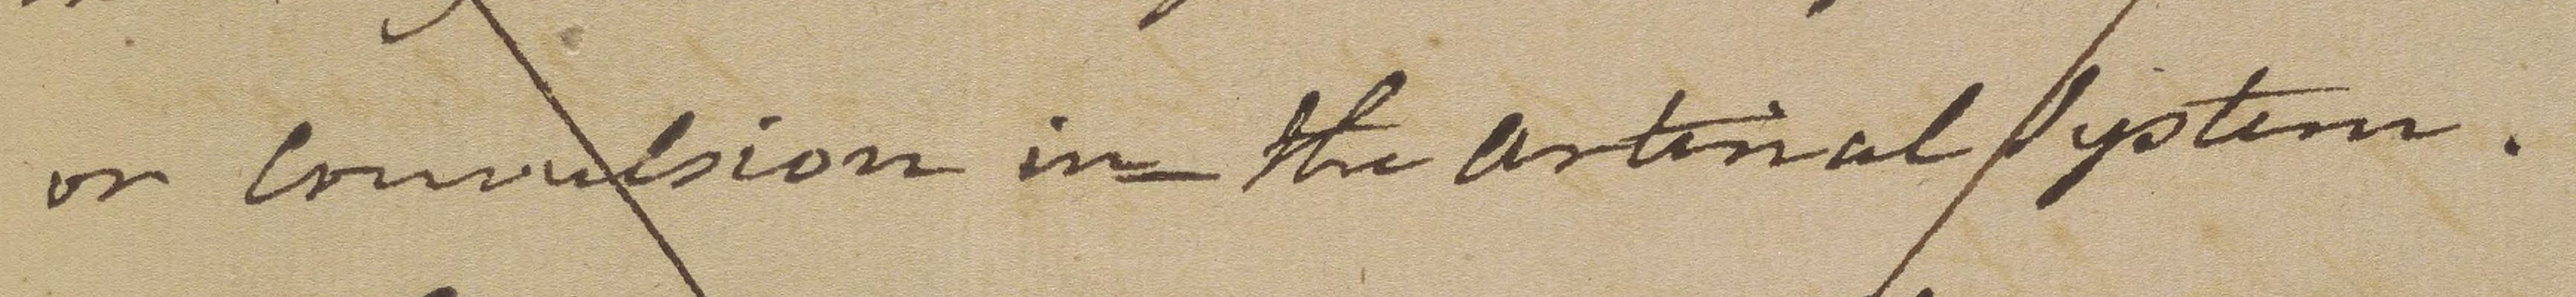or convulsion in the arterial system
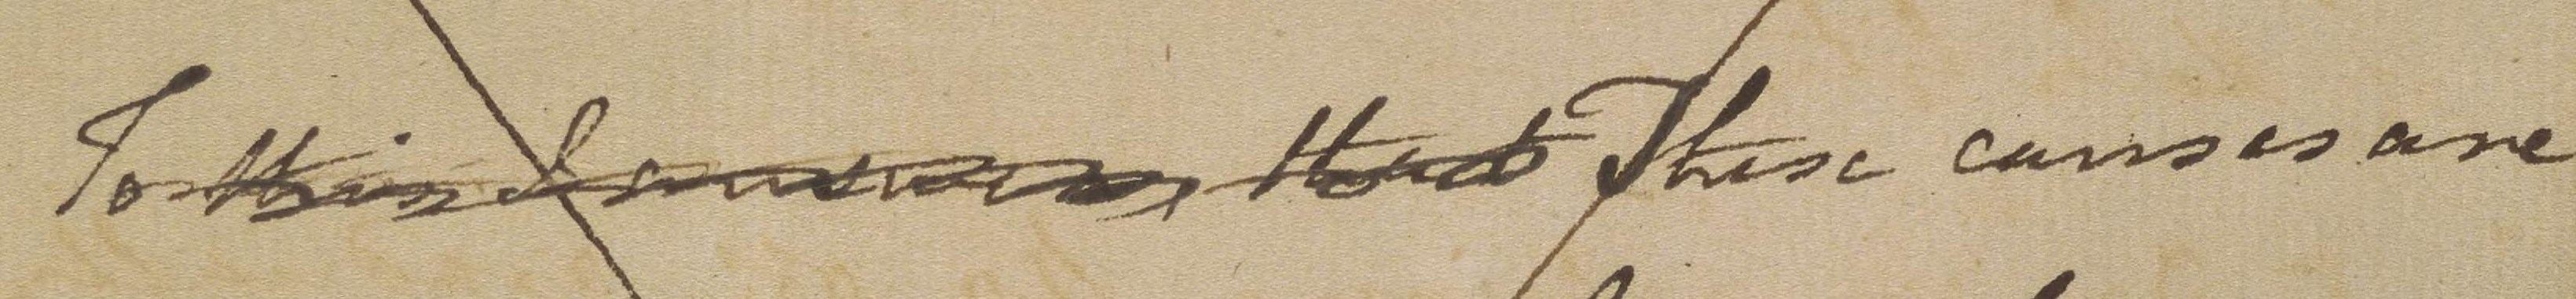To [this I answer that] These causes are
